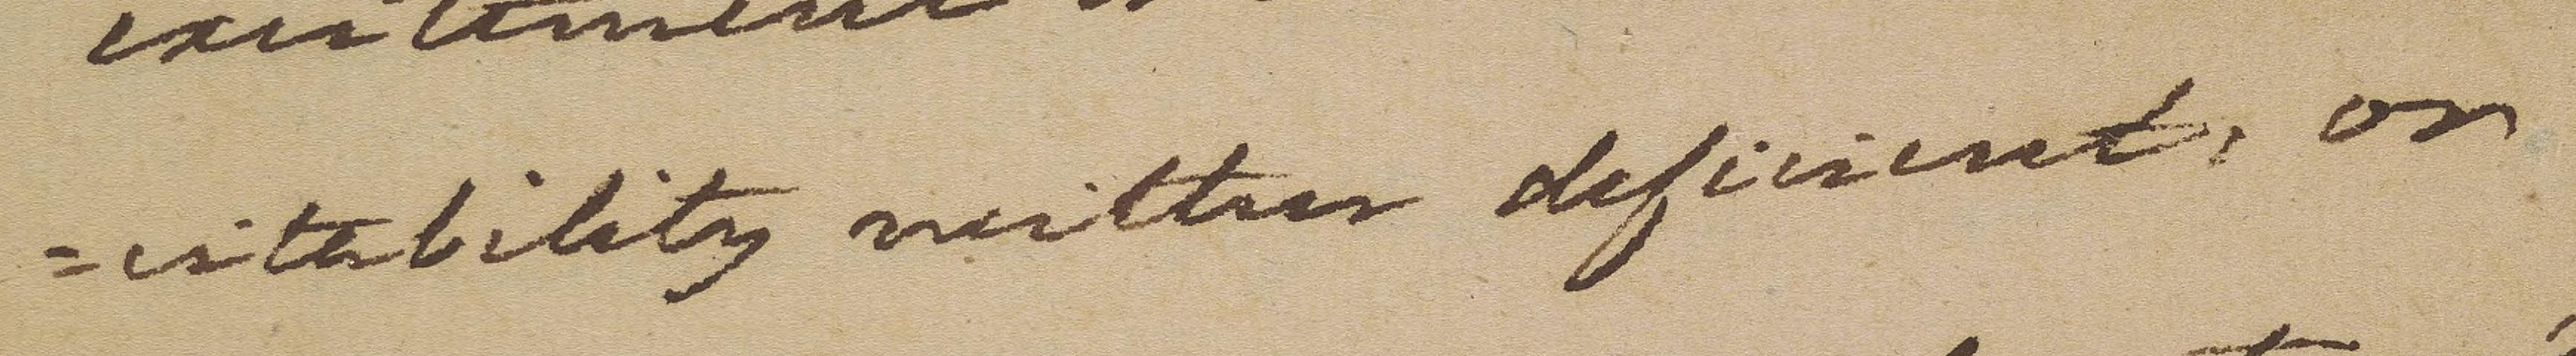-citability rather deficient, or
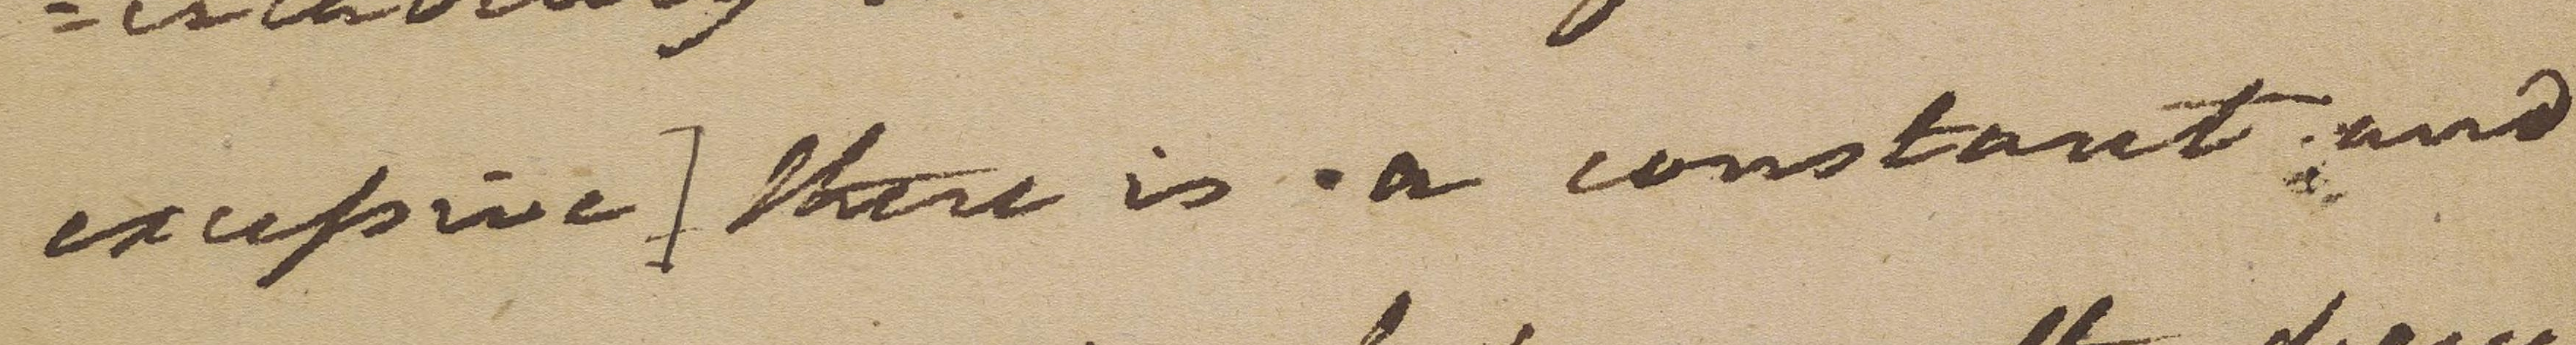excessive) there is a constant and
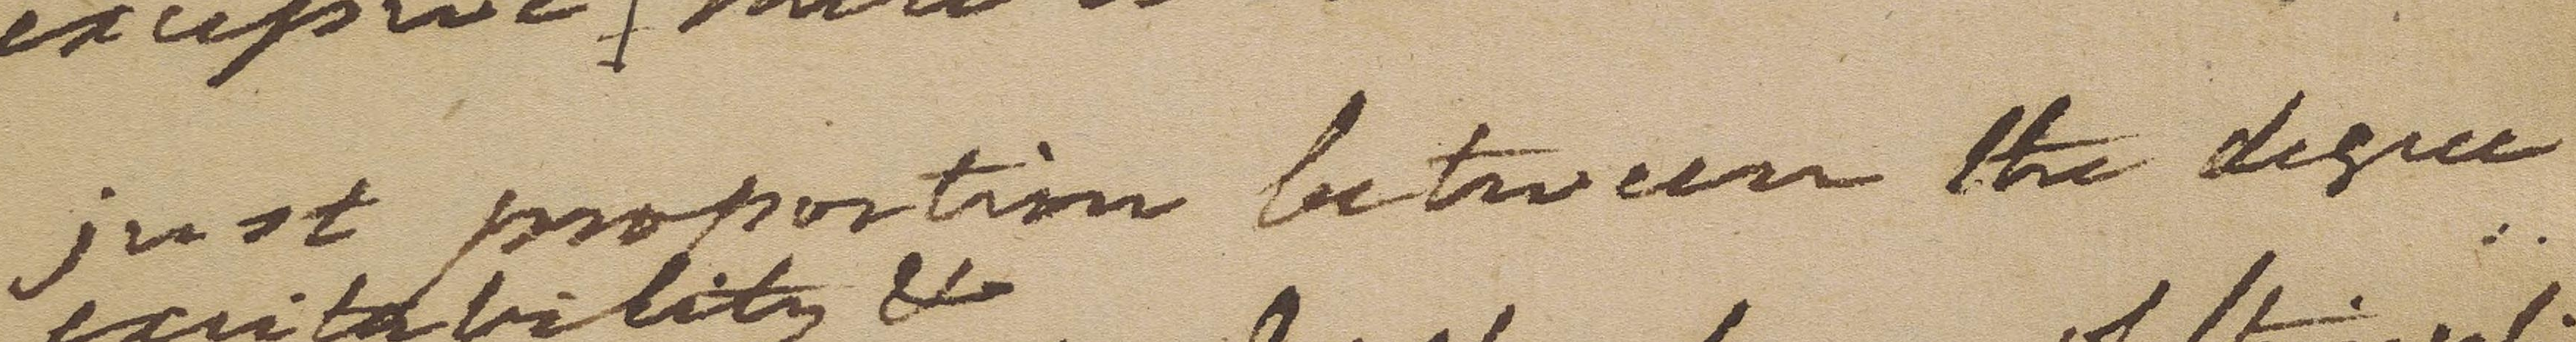just proportion between the degree
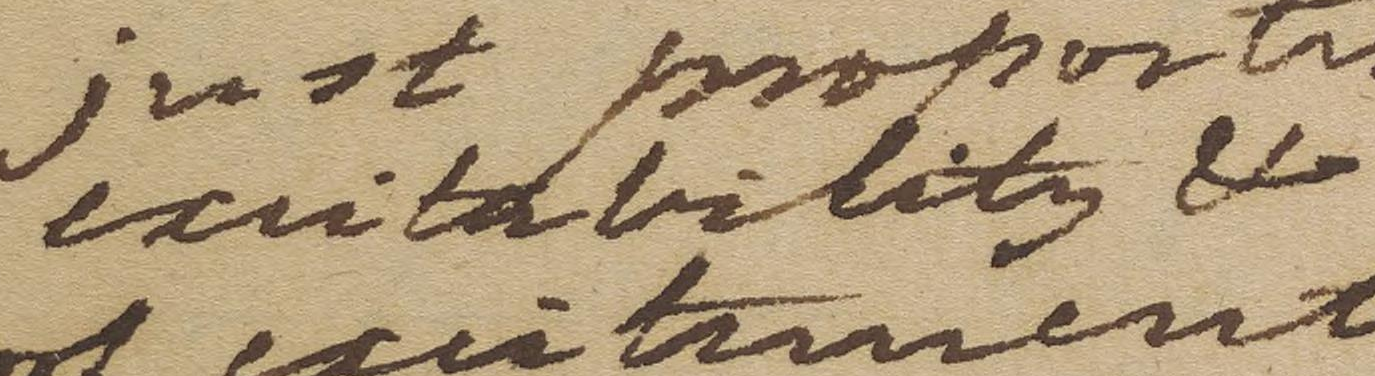excitability &
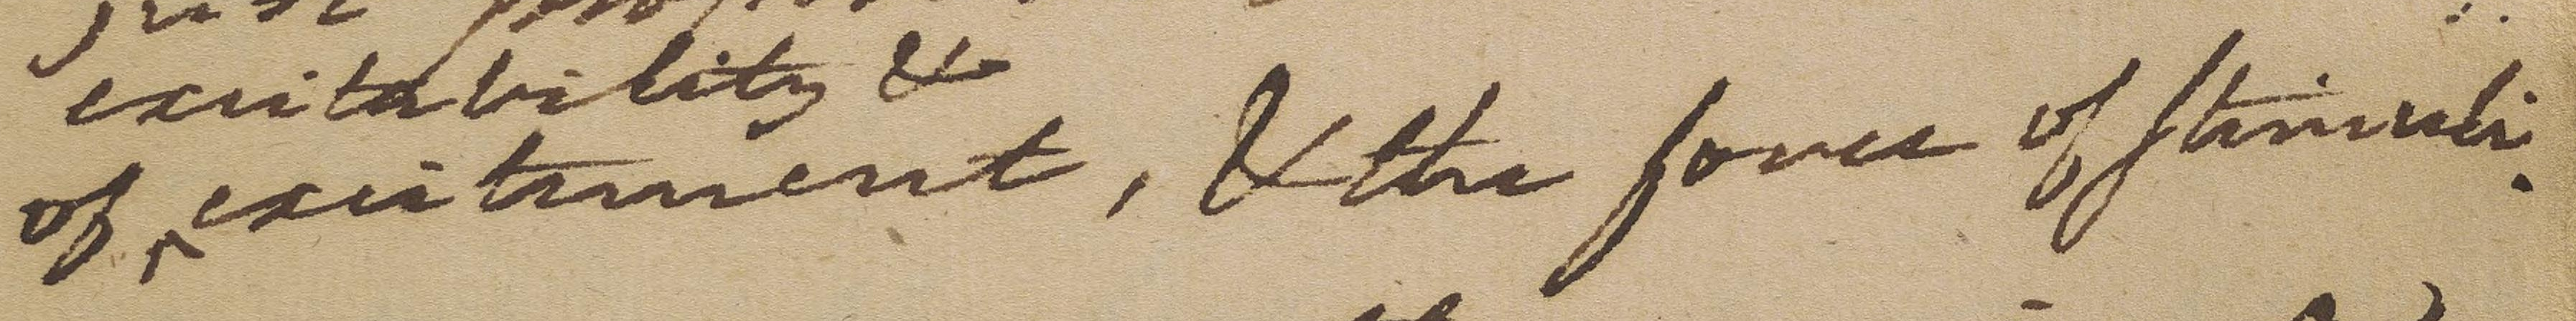of ^ excitement, & the force of stimuli
